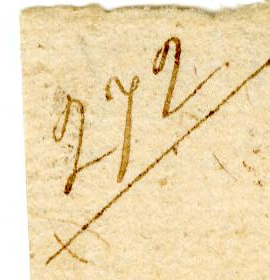272
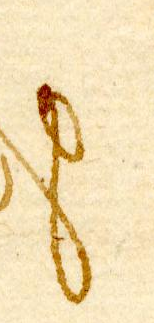To
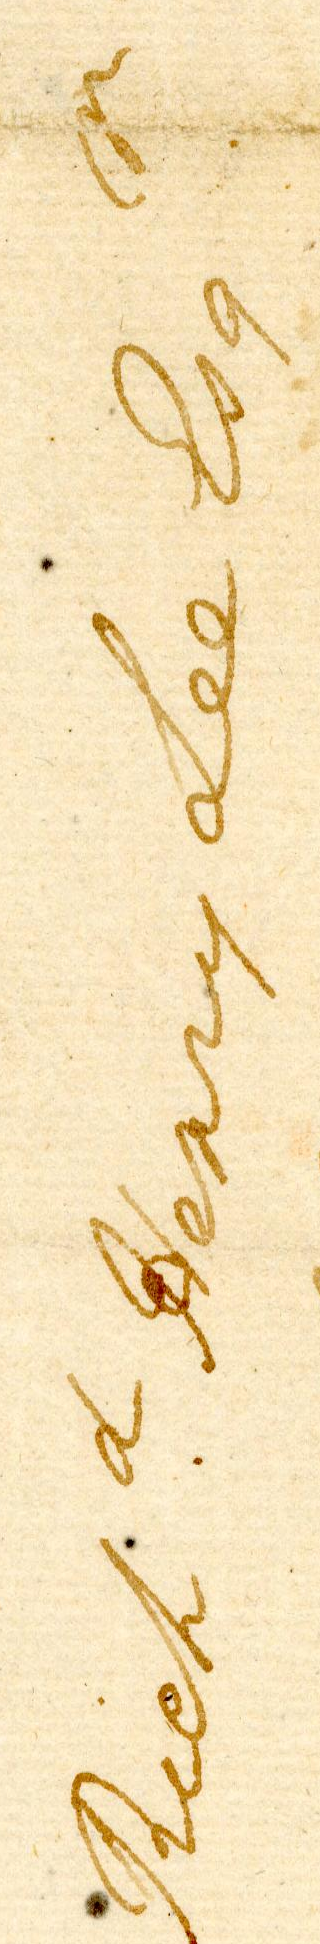Rich^d. Henry Lee Esq^r
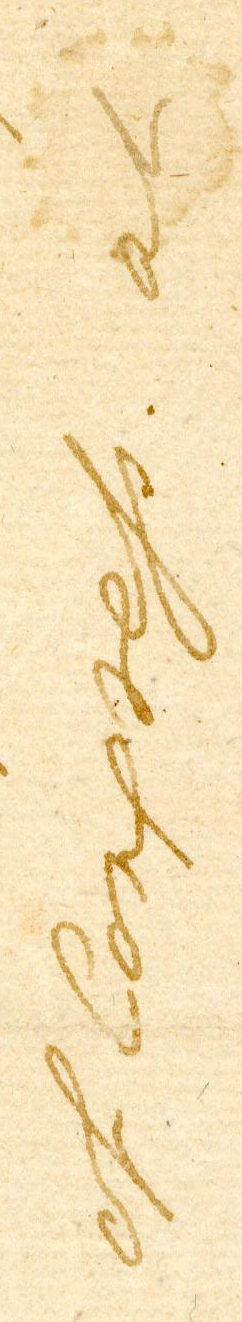of Congress at
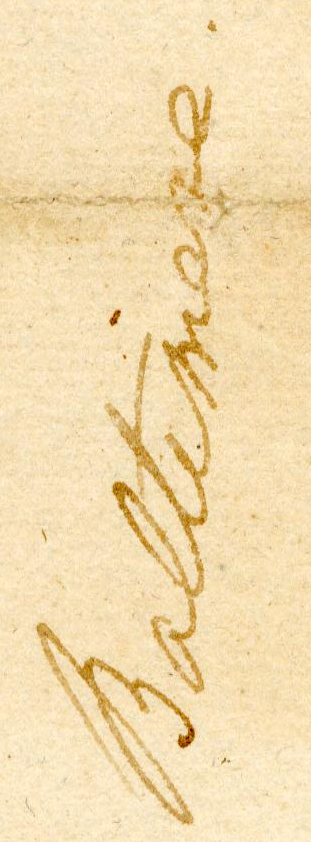Baltimore
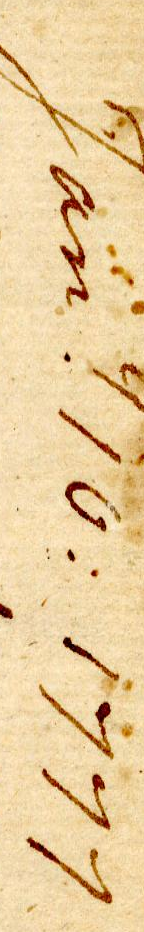Jan^y. 10: 1777
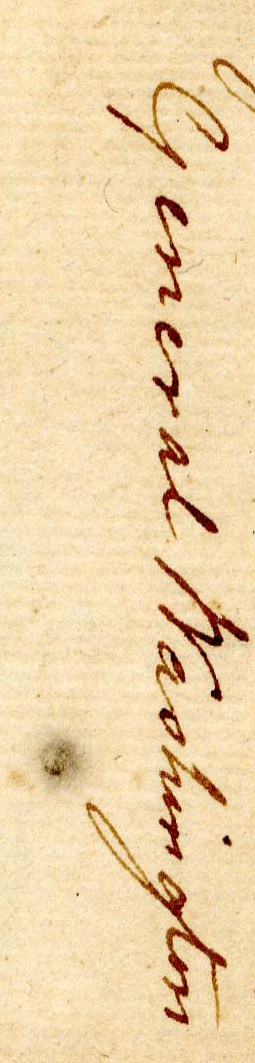General Washington
